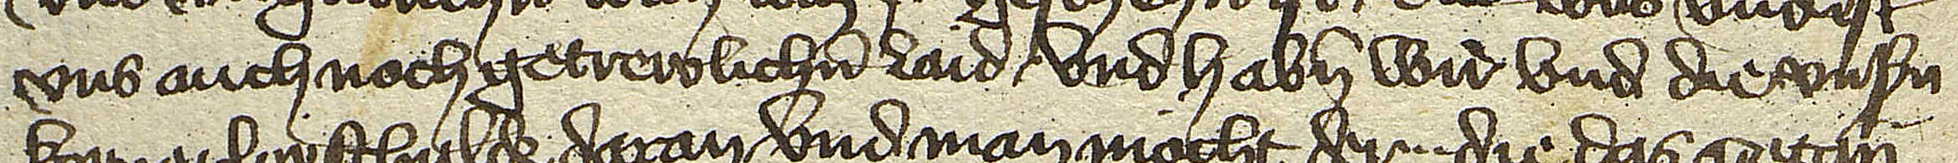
vns auch noch getrewlichn* laid / vnd habn* wir vnd die vnſ*n
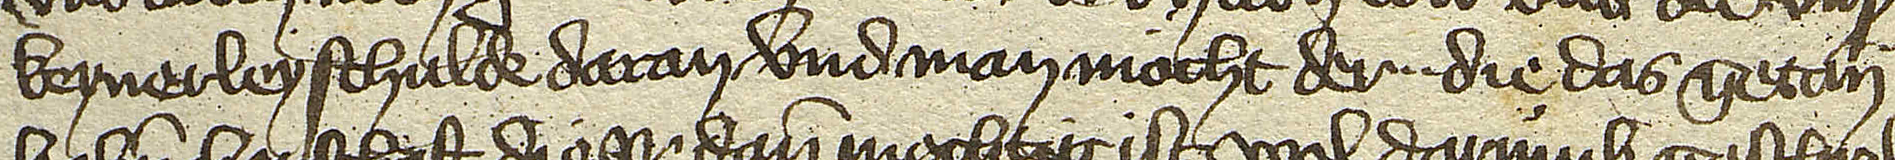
keynerley ſchulde daran / vnd man möcht der ~ die das getan
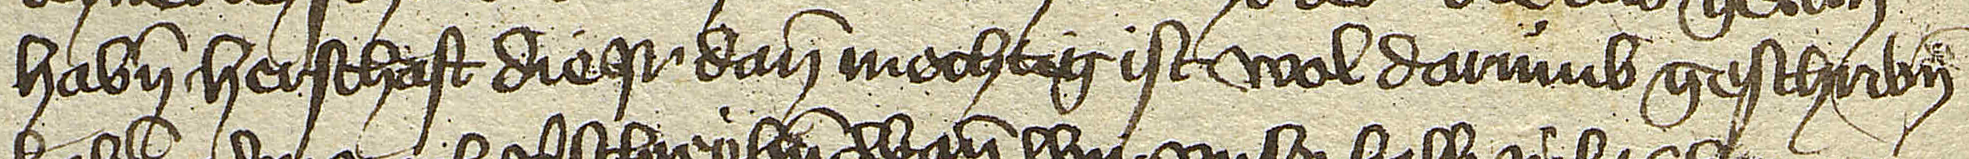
habn* / herſchaft die Ir dan* mechtig iſt / wol darümb geſchribn*
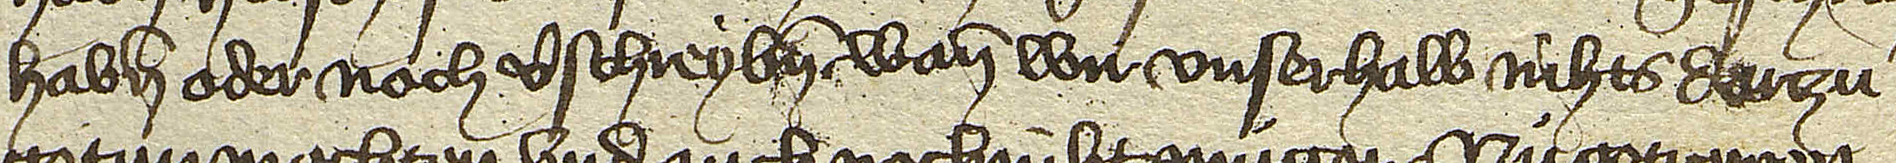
habn* oder noch v*ſchreybn* / wan* wir vnſerhalb nihts darcʒu
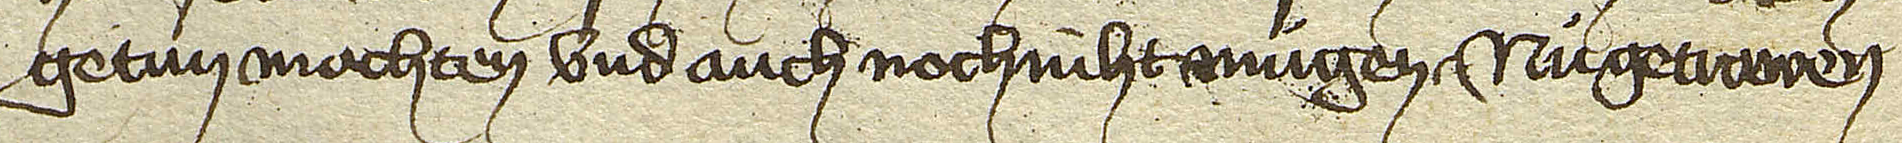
getun mochten vnd auch noch niht mügen / Nü getrawen
